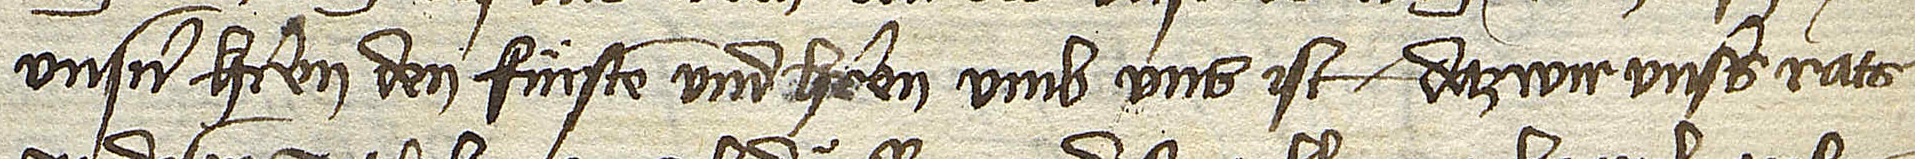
vnſ*n h*ren den fürſte* vnd h*ren vmb vns iſt / daʒ wir vnſ*s rats
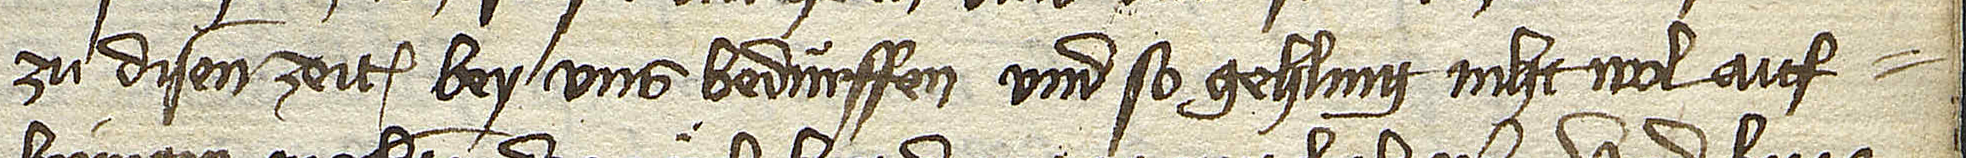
ʒu diſen ʒeit* bey vns bedürffen vnd ſo gehling niht wol auf =
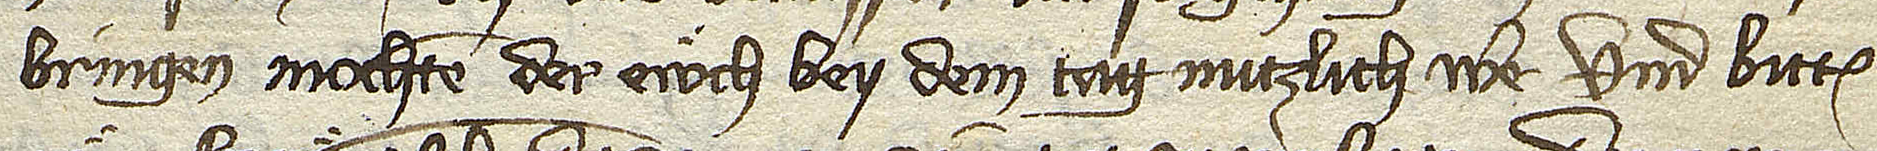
bringen mochte* der ewch bey dem tag nucʒlich we* Vnd bitt*
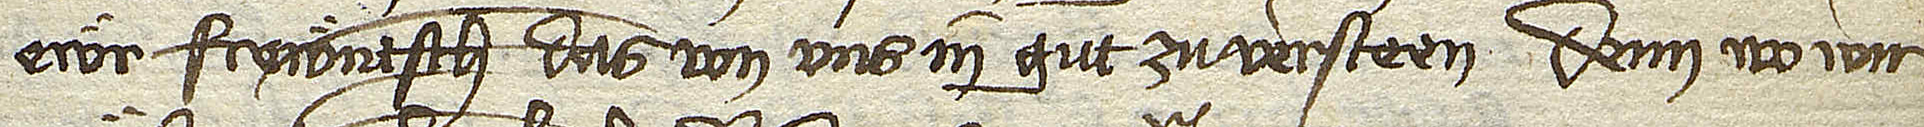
ewr frewntſch* das von vns in gut ʒu verſteen Denn wo wir
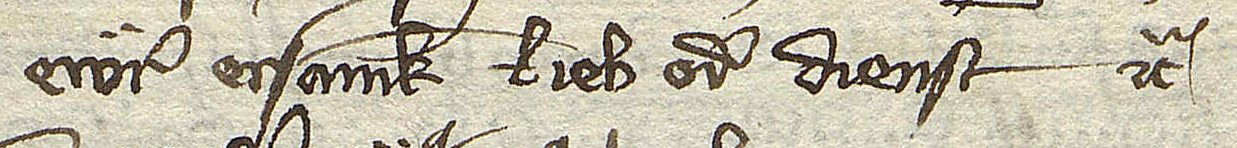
ewr erſamk* lieb od* dienſt ec*
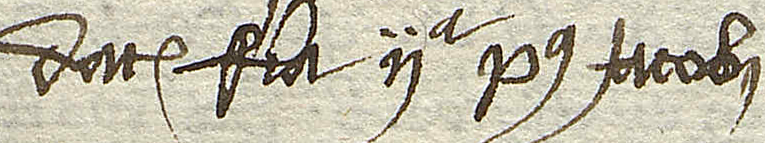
Dat* fia* ii* p* Iacobi
